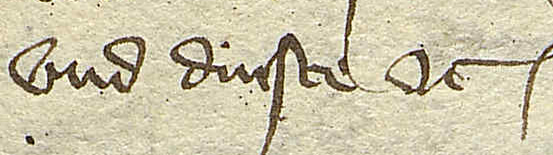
vnd dinſte ec*
